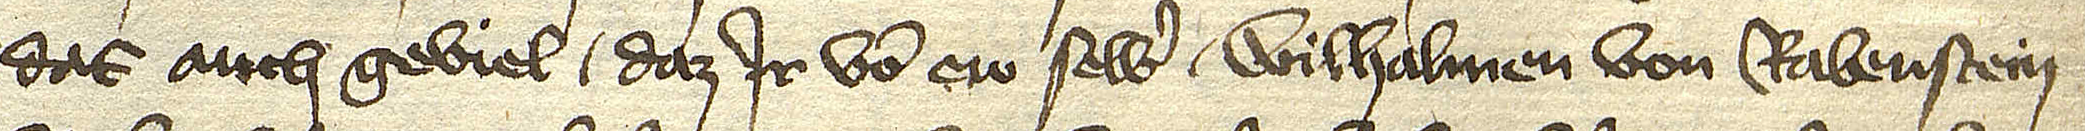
das auch geviel / daʒ Ir vo* ew ſelb* / Wilhalmen von Rabenſtein
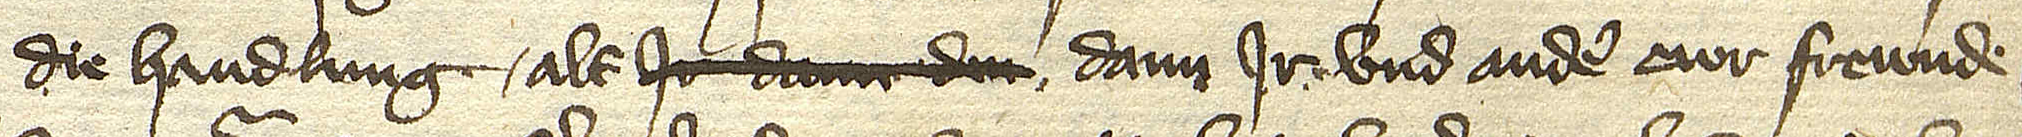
die handlung / als Ir dann den dann Ir vnd ande* ewr frewnde
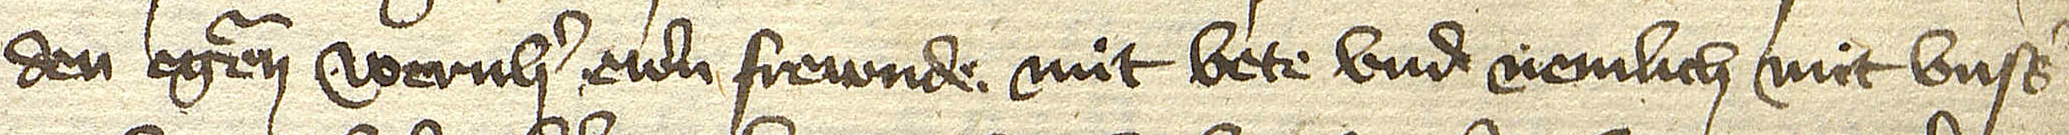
den egen* wernh* ew*n frewnde mit bete vnd nemlich mit vnſs*
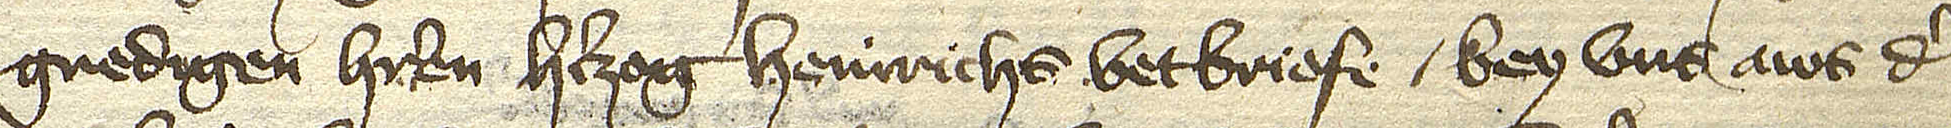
gnedigen hr*en h*cʒog heinrichs betbriefe / bey vns aws d*
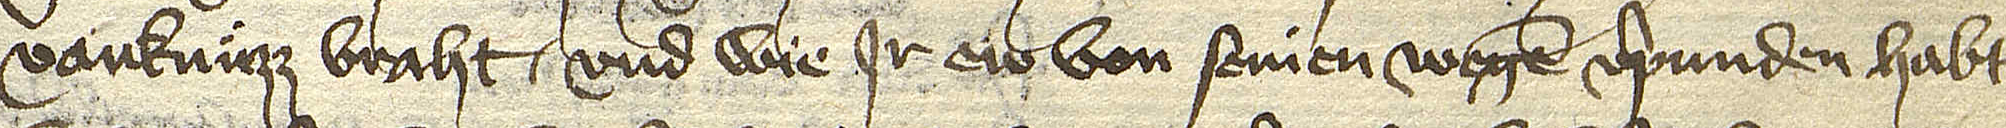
vanknüʒʒ braht / vnd wie Ir ew von ſeinen wege* v*punden habt
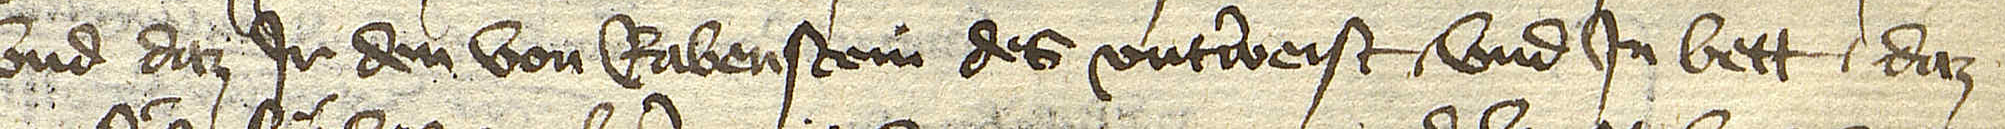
vnd daʒ Ir den von Rabenſtein des vnt*weiſt / vnd In bett / daʒ
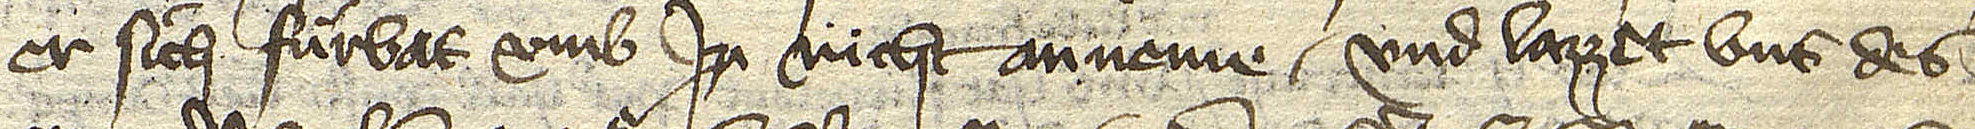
er ſich fürbas vmb In nicht anneme / vnd laʒʒet vns des
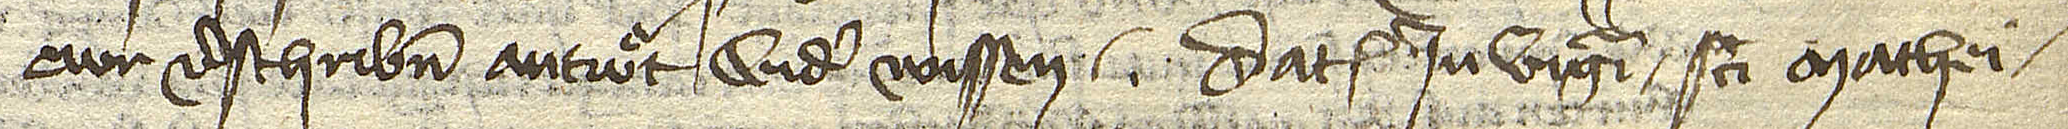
ewr v*ſchribn* antw*t wid* wiſſen / . Dat* In vigi* / ſci* Mathei /
